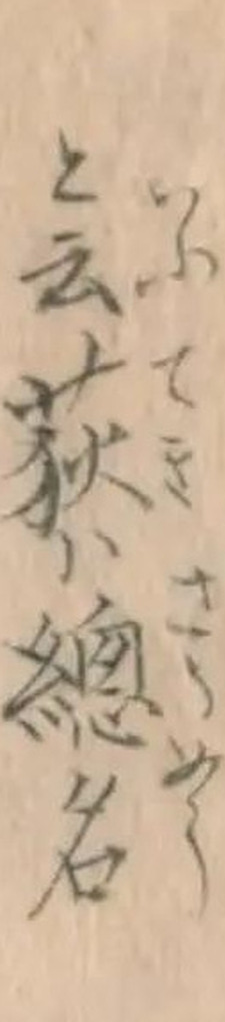と云萩は總名
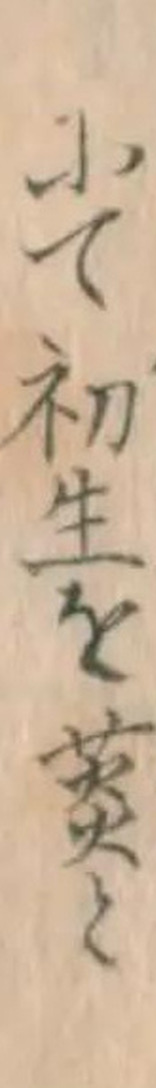にて初生を菼と
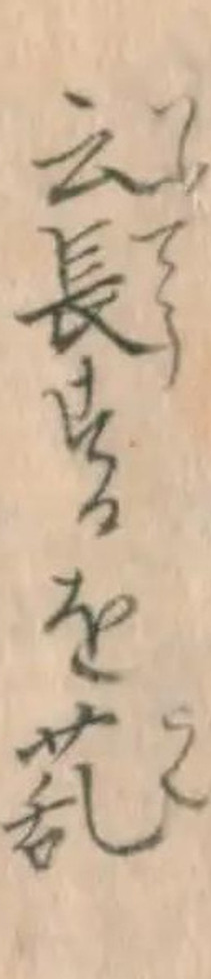云長するを乱
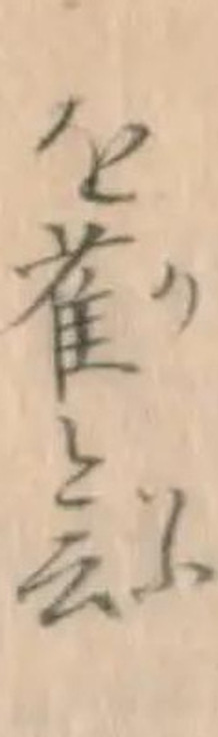を萑と云

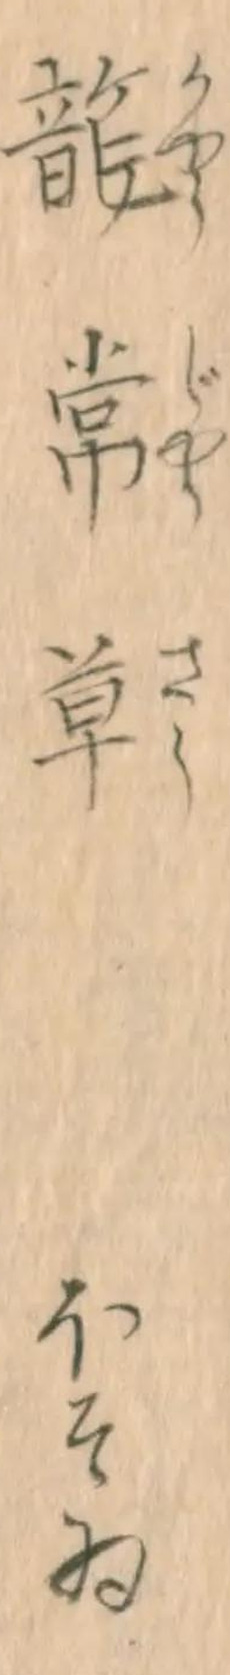龍常草ほそゐ
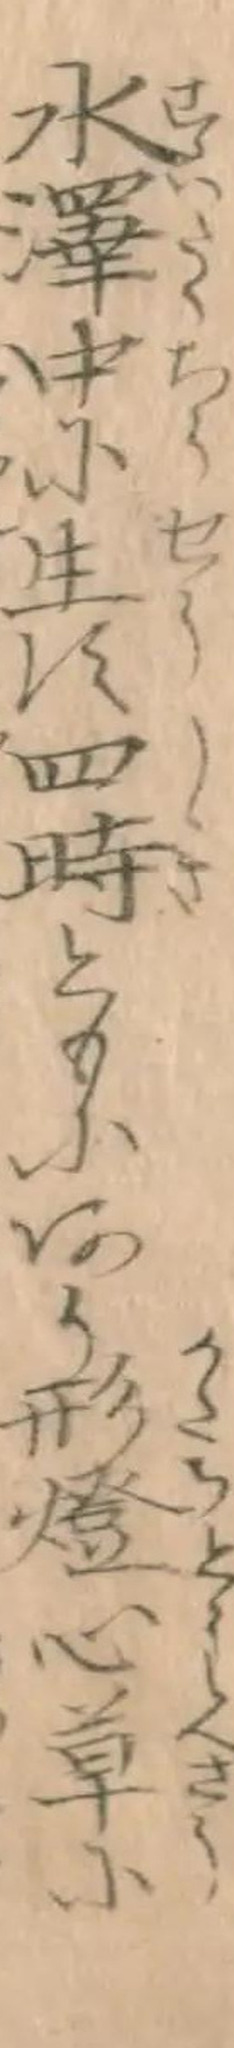水澤中に生す四時ともにあり形燈心草に
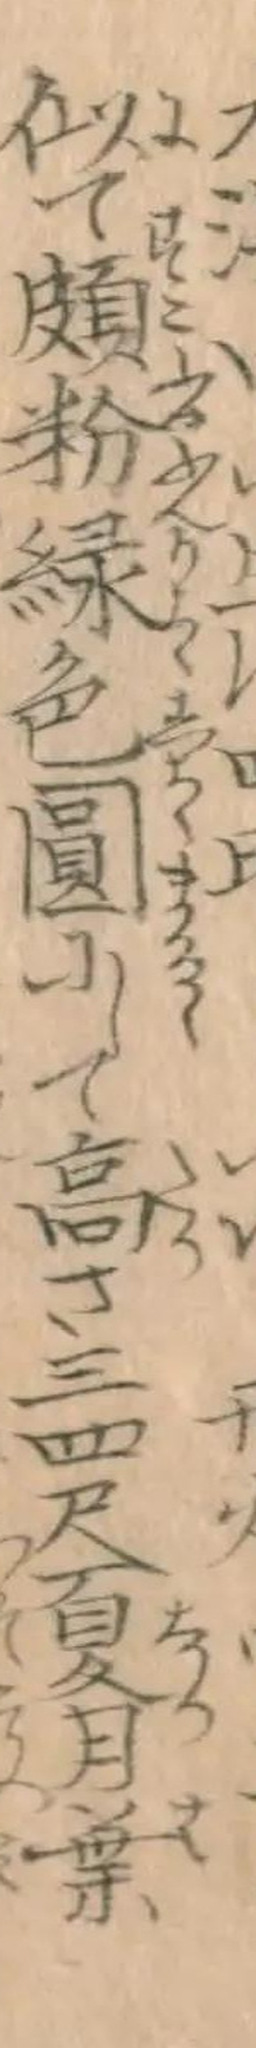似て頗粉緑色圓にて高さ三四尺夏月葉
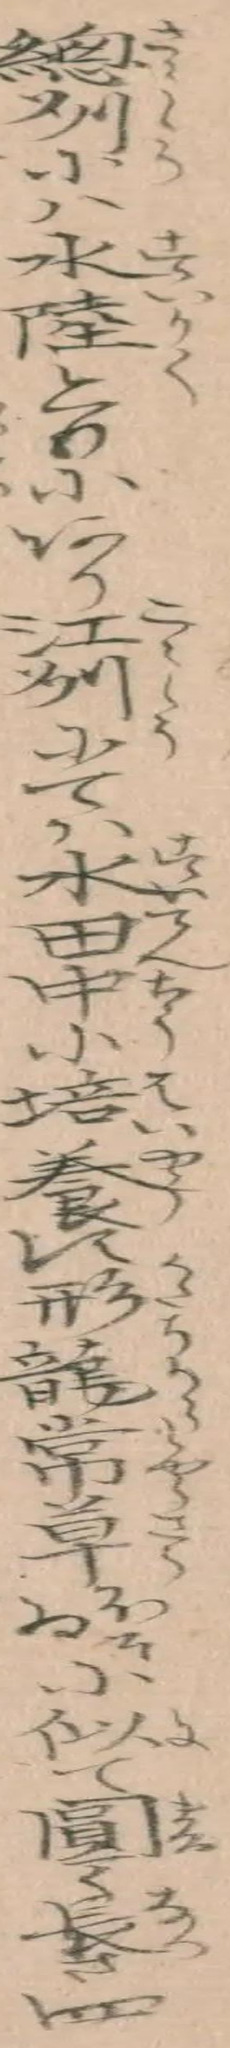總州には水陸ともにあり江州にては水田中に培養す形龍常草ほそゐに似て圓く長さ四
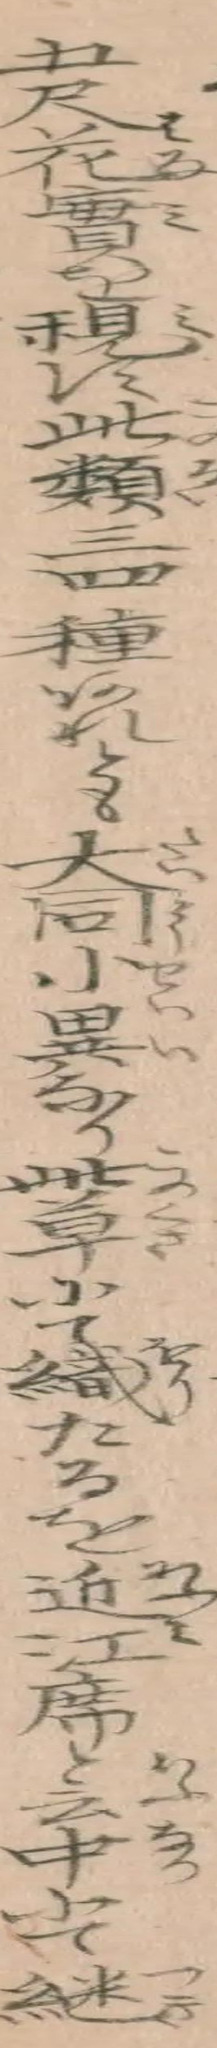五尺花實を視す此類三四種あれとも大同少異なり此草にて織たるを近江席と云中にて継
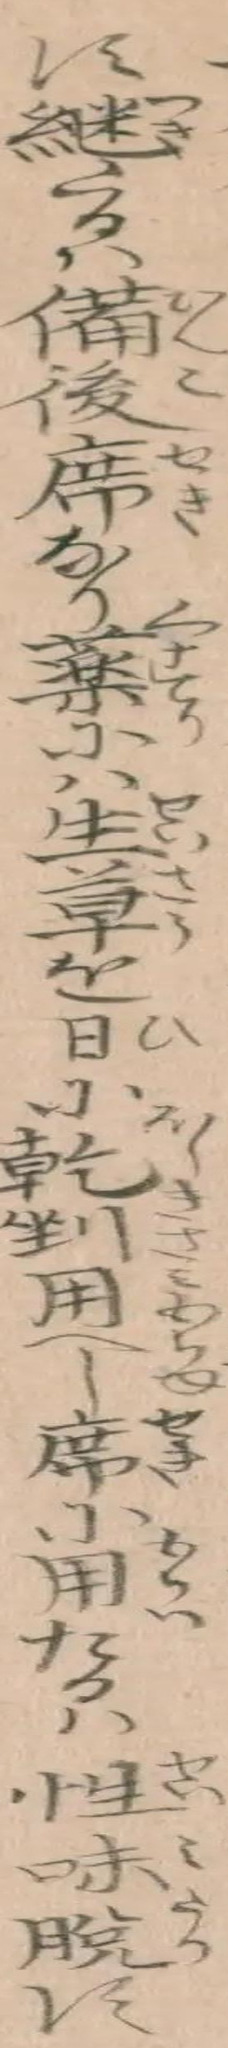す継たるは備後席なり薬には生草を日に乾剉用へし席に用たるは性味脱す
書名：本草図譜. 巻16-18
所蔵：国立国会図書館 National Diet Library, JAPAN
